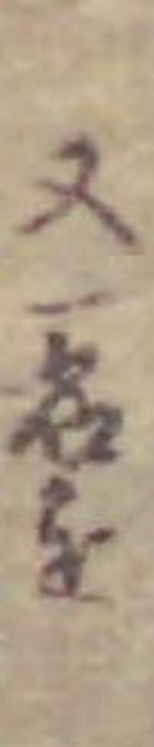又一名を
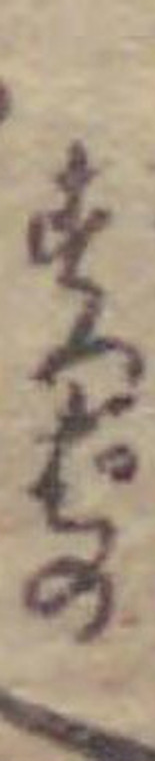すつぱの
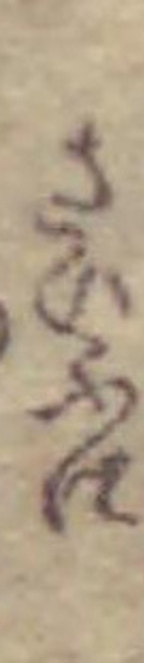さいふに
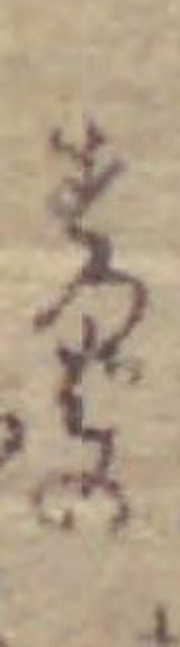すつぱの

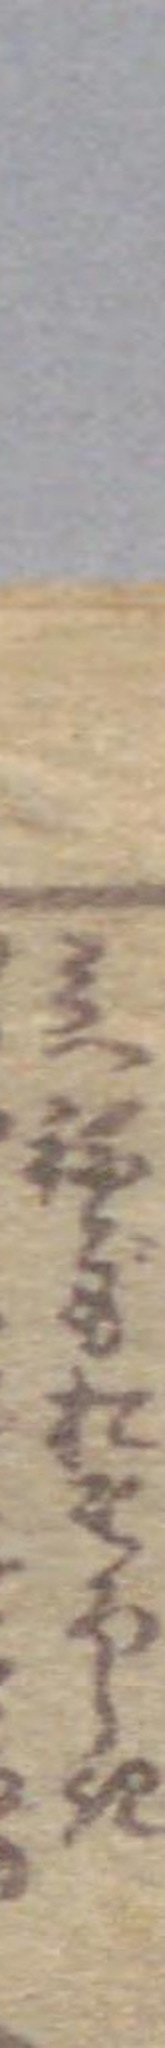みへねどもおそろしき
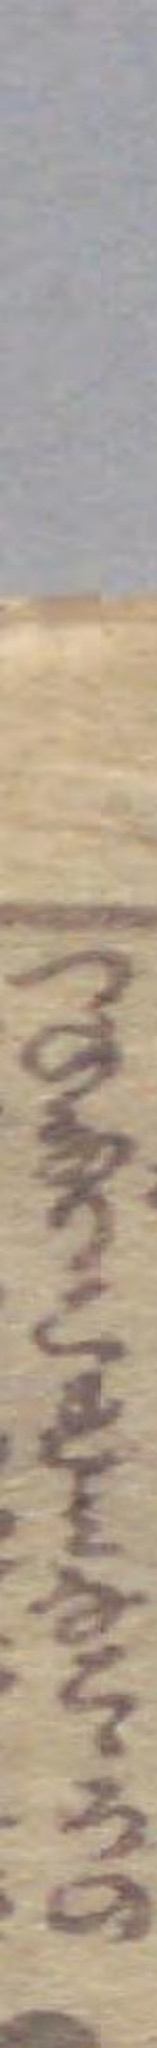つのなりこれみなこゝろの
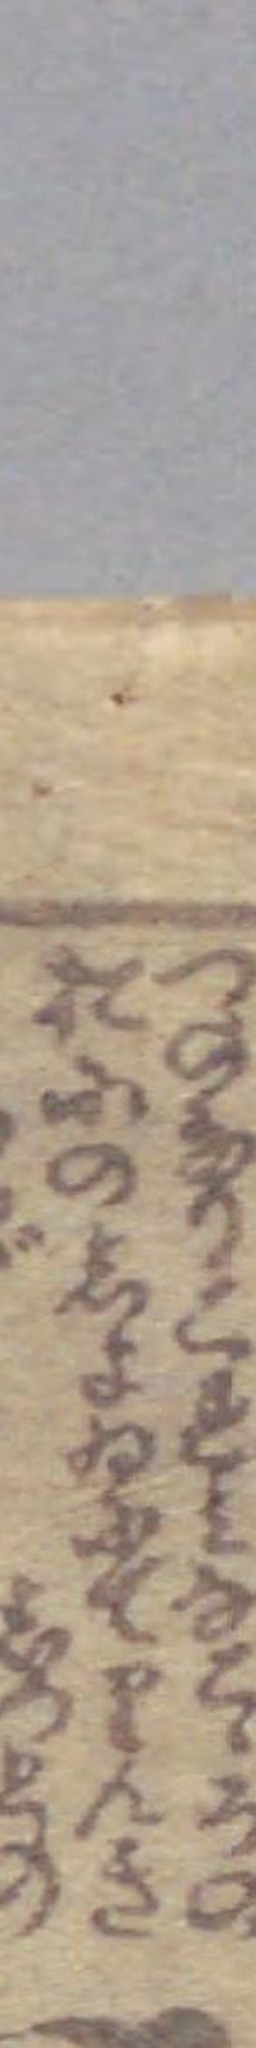おにのしよゐにてりんき
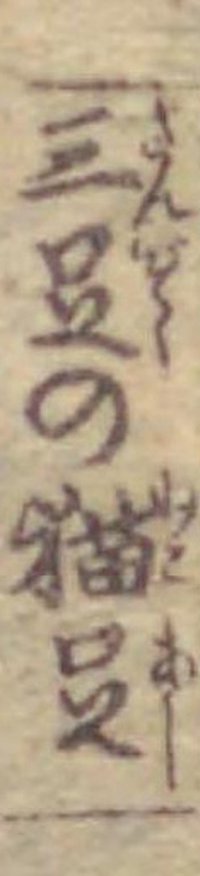三足の猫足
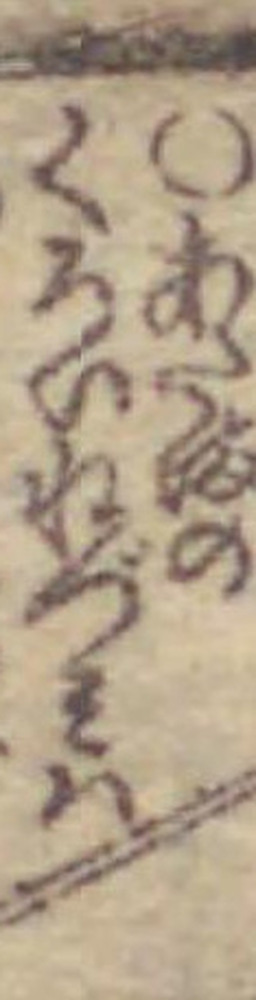くろいねづみは
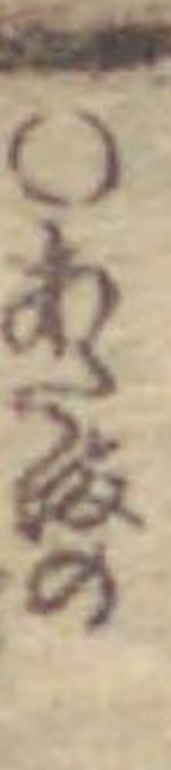○あたまの
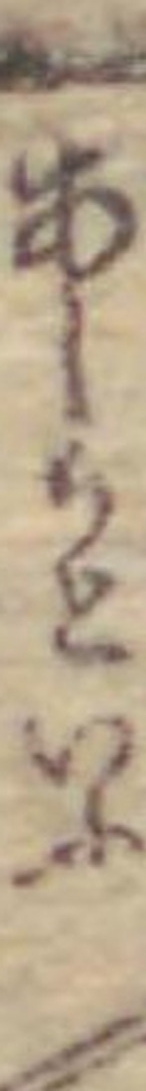あしかといふ
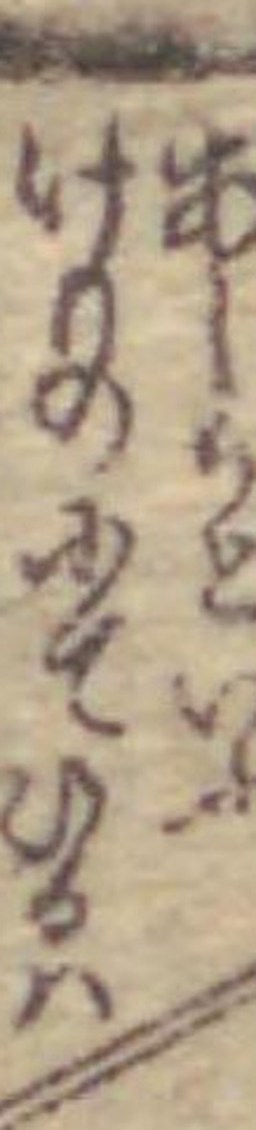けものにてひるは
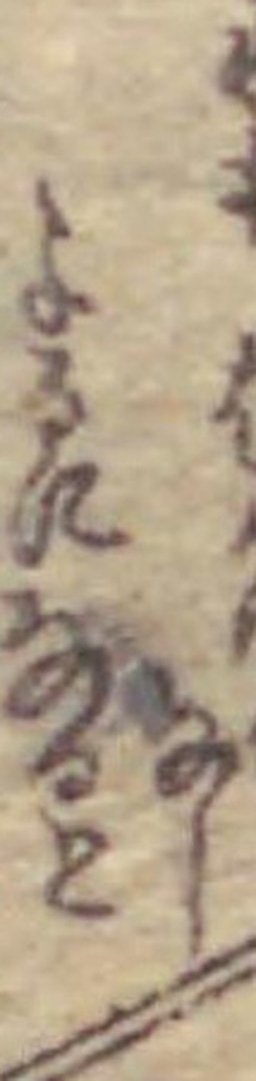よるになると
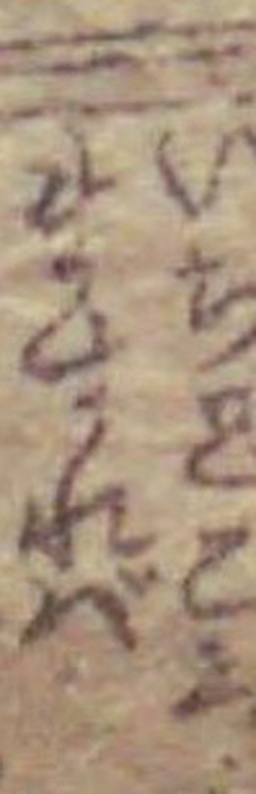ますれば
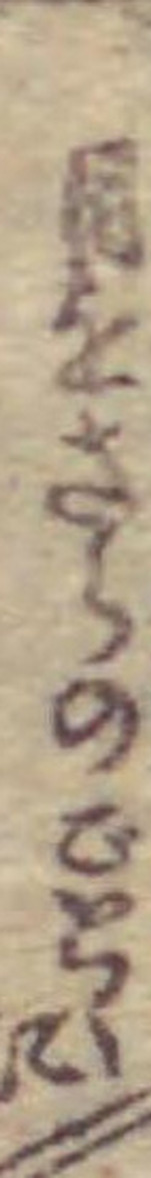目をさらのごとく
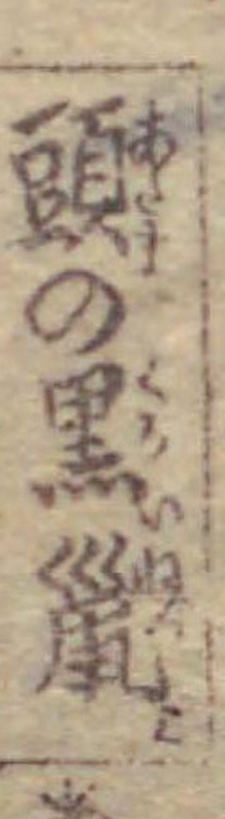頭の黒鼠
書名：化物和本草 : 3巻
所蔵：国立国会図書館 National Diet Library, JAPAN
